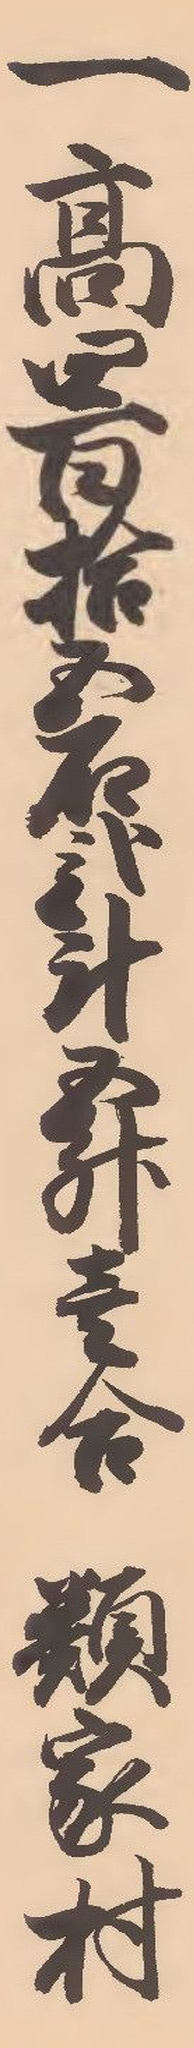一高四百拾五石弐斗五升壱合類家村
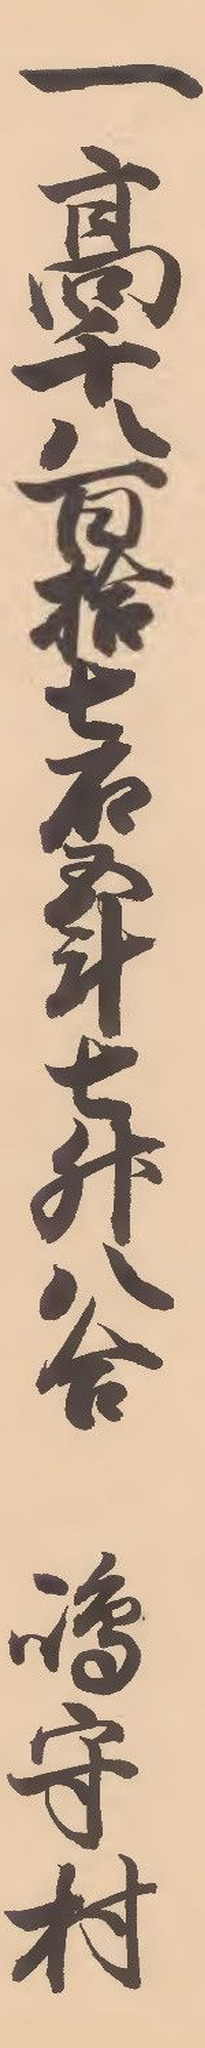一高千八百拾七石五斗七升八合嶋守村
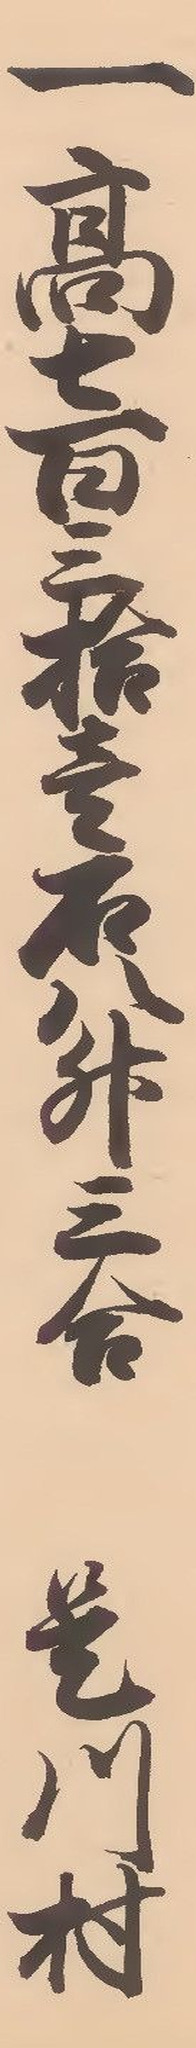一高七百三拾壱石八升三合是川村
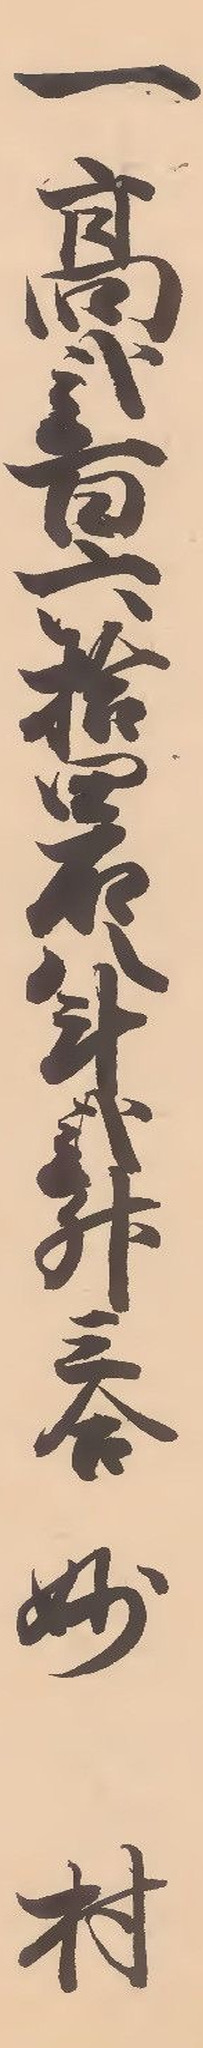一高弐百六拾四石八斗弐升三合妙村
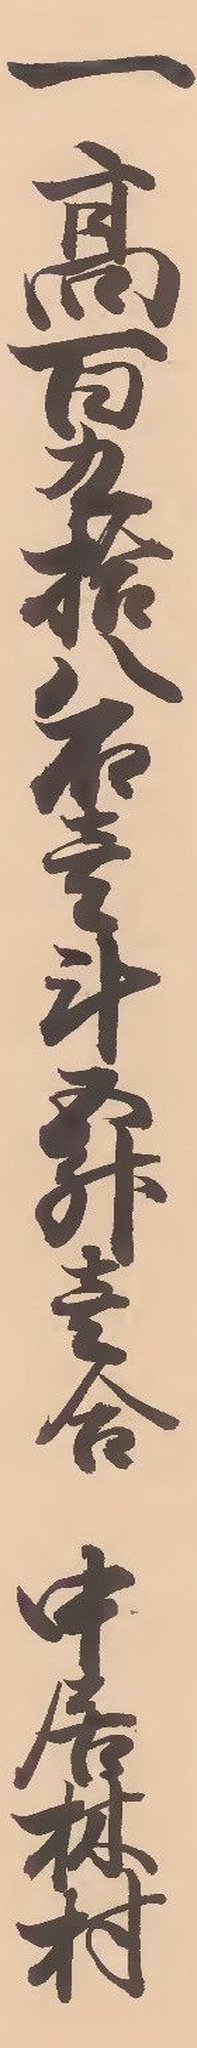一高百九拾八石壱斗五升壱合中居林村

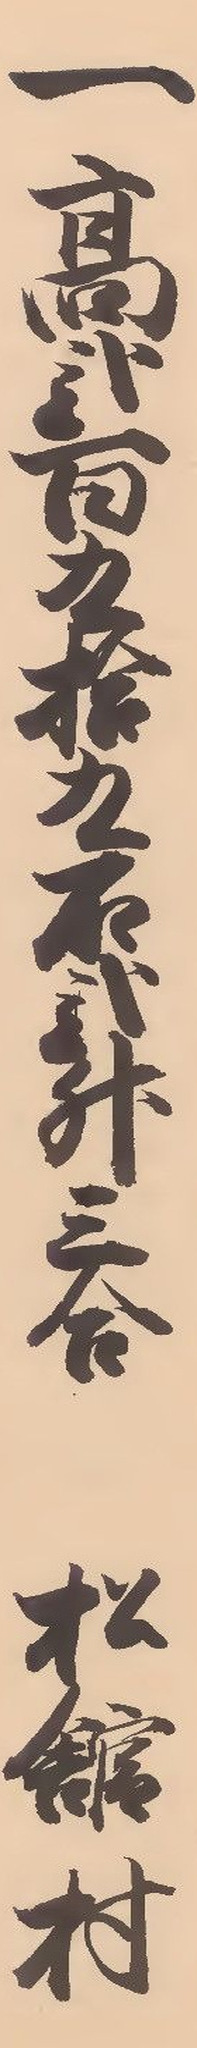一高弐百九拾九石弐升三合松館村
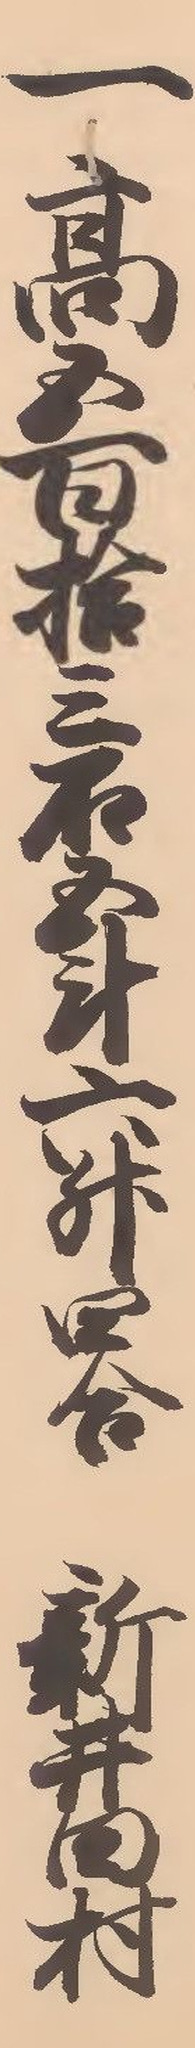一高五百拾三石五斗六升四合新井田村
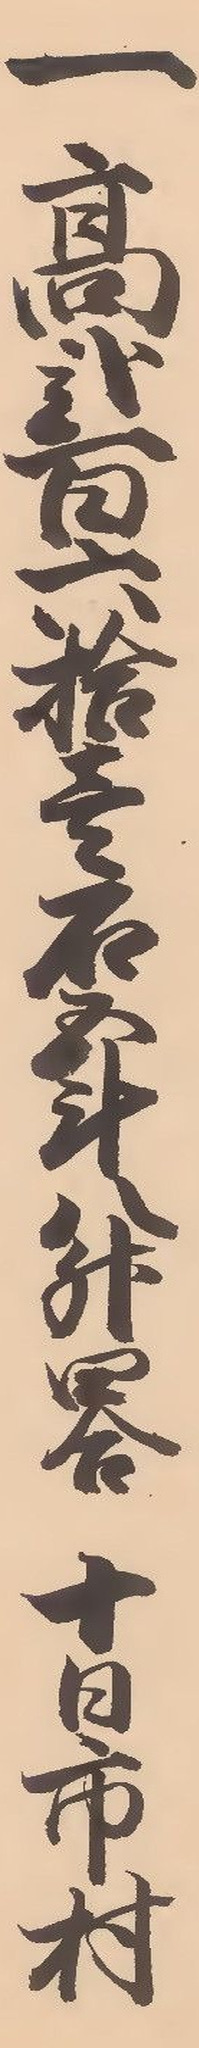一高弐百六拾壱石五斗八升四合十日市村
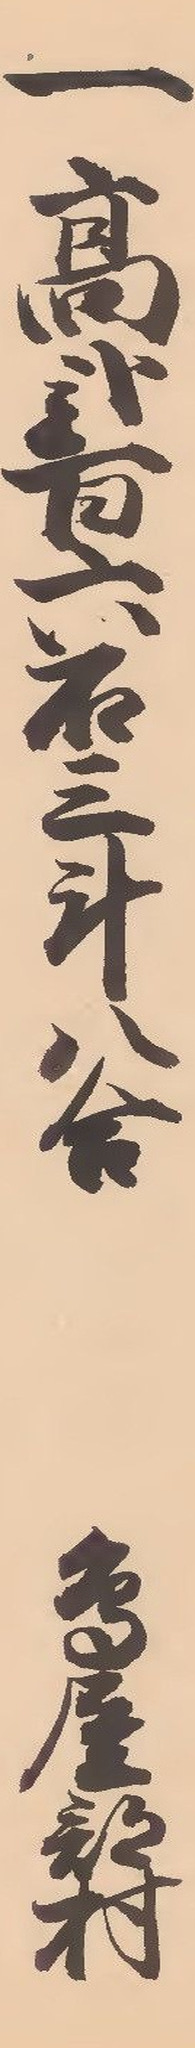一高弐百六石三斗八合鳥屋部村
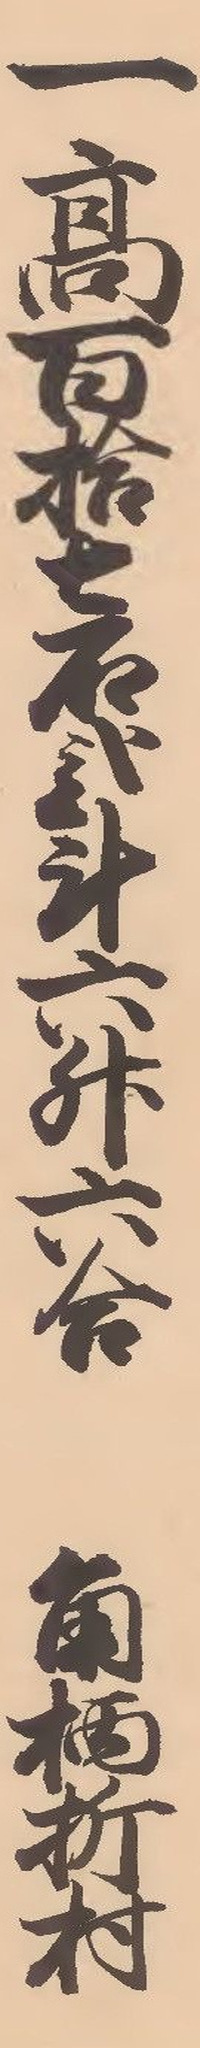一高百拾七石弐斗六升六合角柄折村
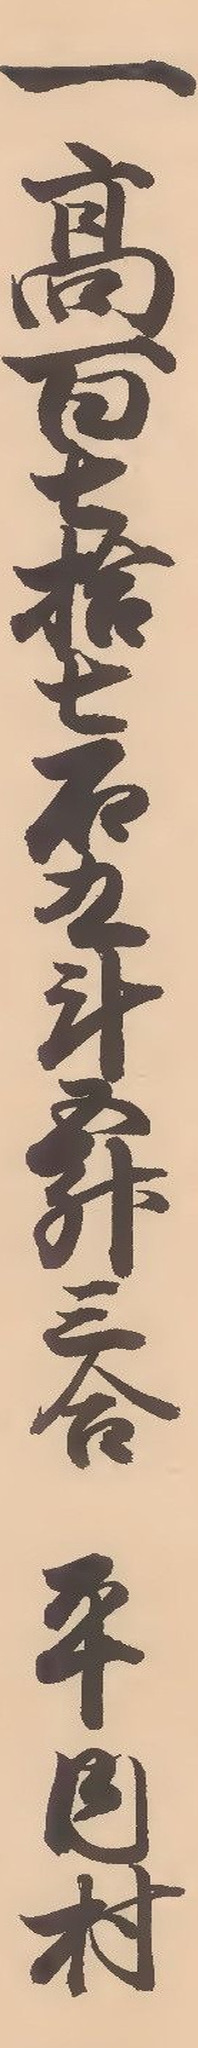一高百七拾七石九斗五升三合平内村
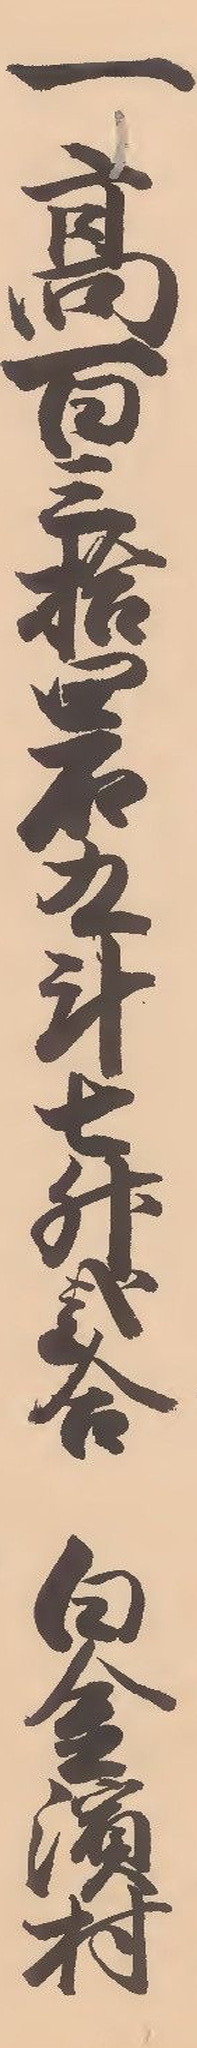一高百三拾四石九斗七升弐合白金浜村
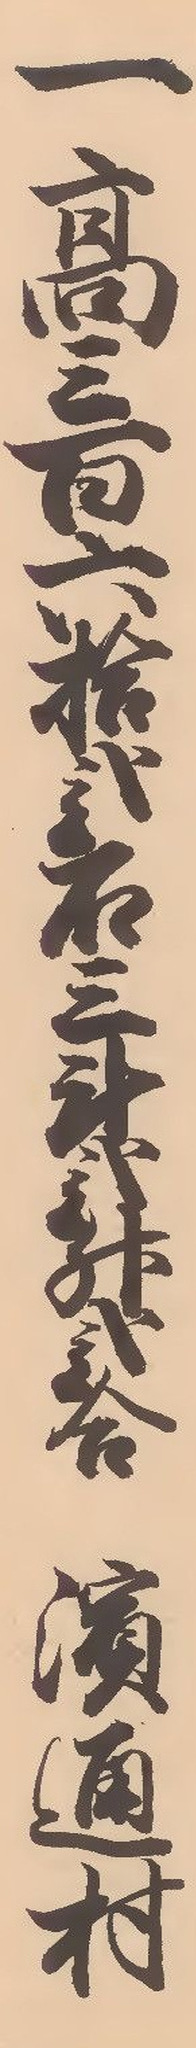一高三百六拾弐石三斗弐升弐合浜通村

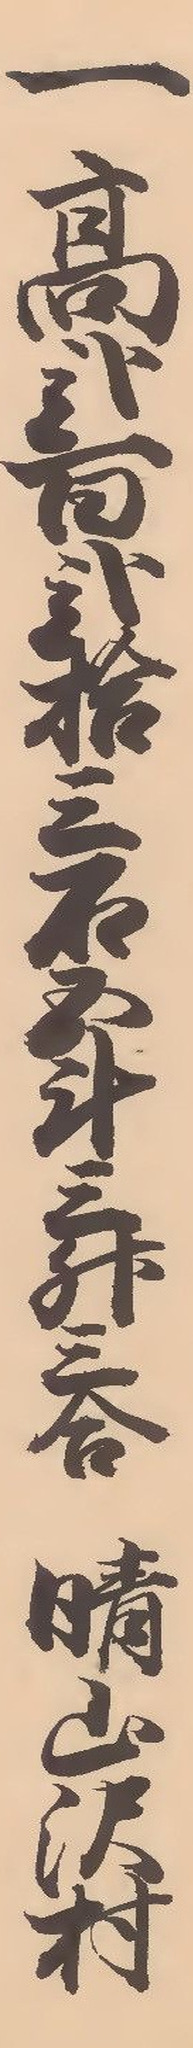一高弐百弐拾三石五斗三升三合晴山沢村
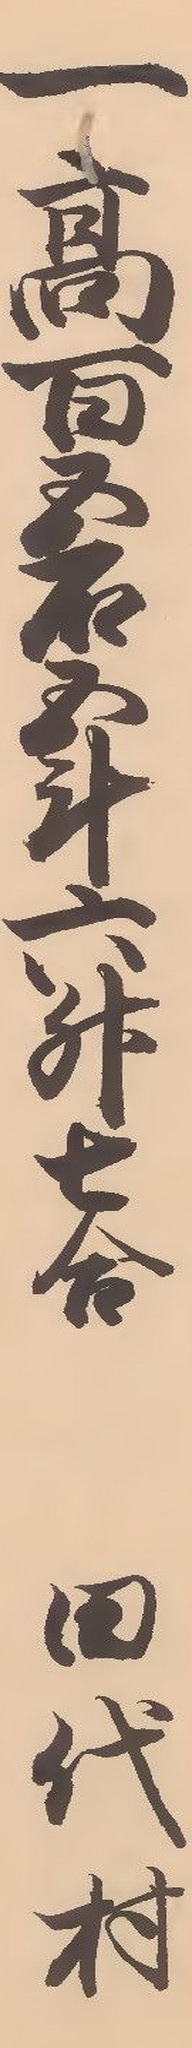一高百五石五斗六升七合田代村
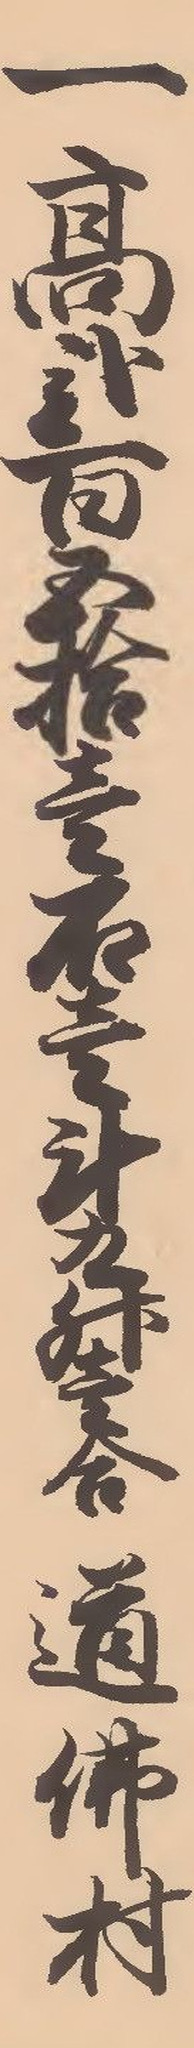一高弐百五拾壱石壱斗九升壱合道仏村
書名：陸奥国郷帳　６
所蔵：国立公文書館 National Archives of Japan
